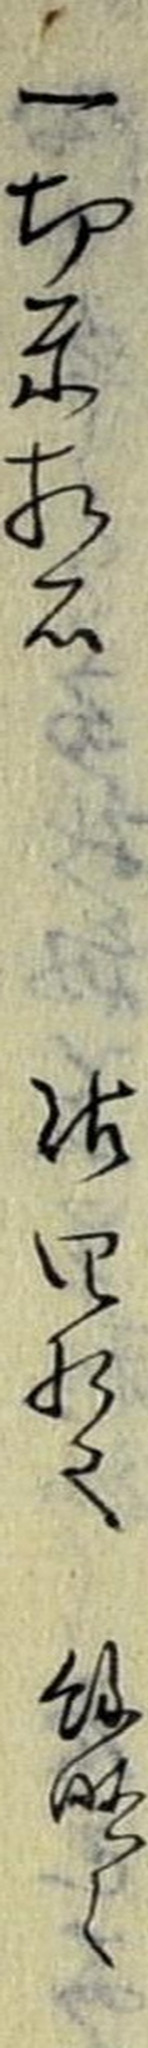一切米拾石銀四拾匁余略之
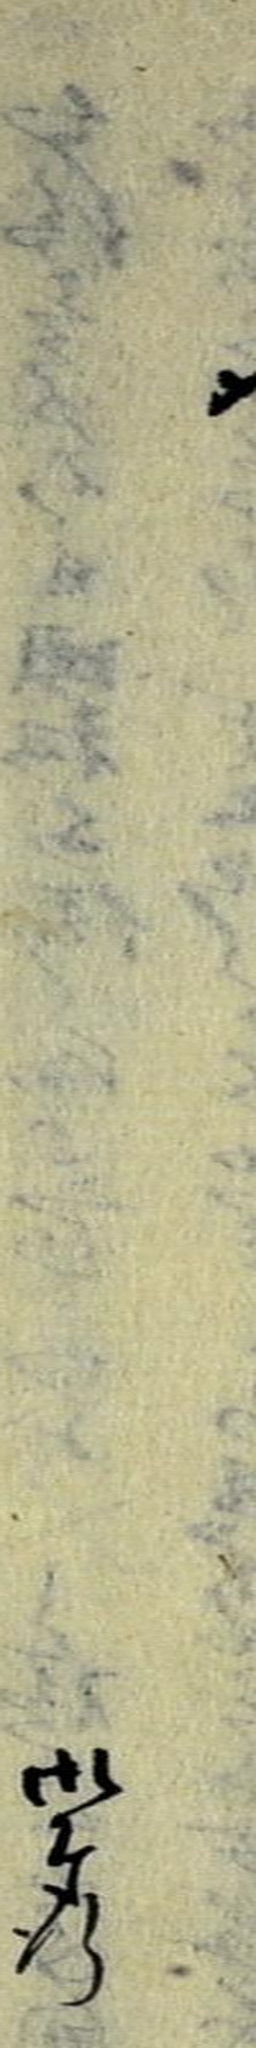御奉行
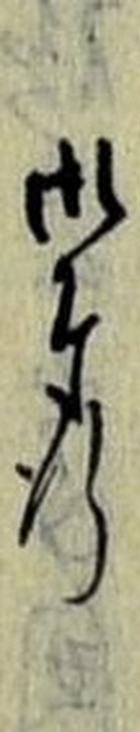御奉行
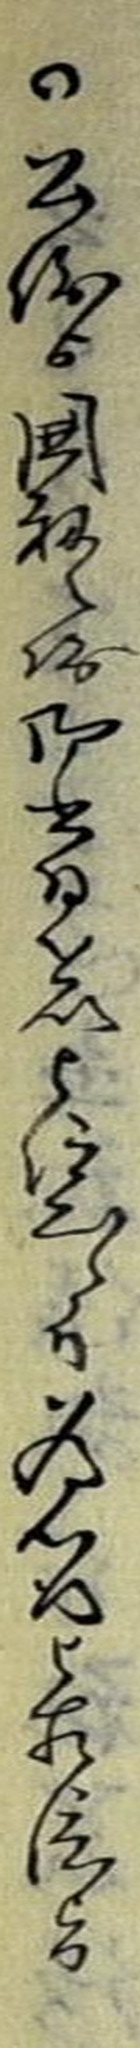〇公儀ゟ囲籾之儀御書付を以被仰出候に付為心得被相渡旨
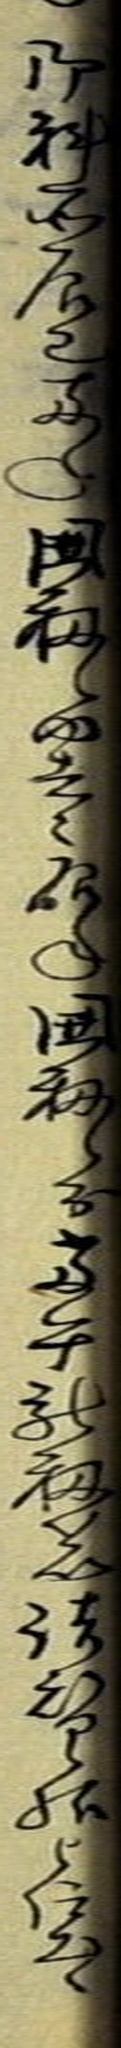〇御料所辰巳両年囲籾之内去々辰年囲籾之分当午新籾を以詰替候様被仰出候
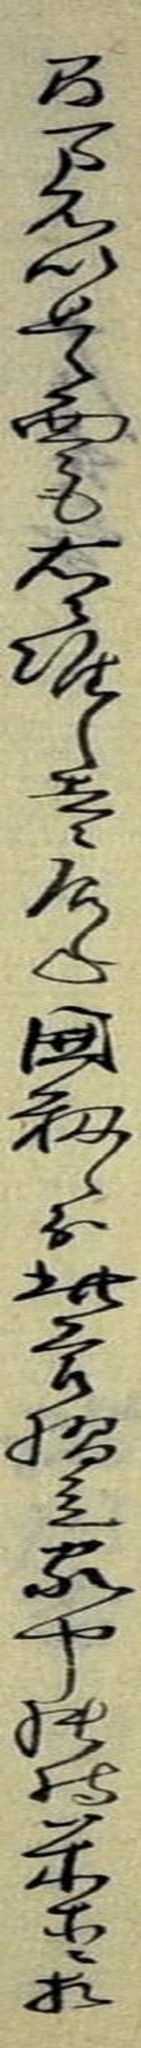間万石以上之面々も右に准し去々辰年囲籾之分此節摺立家中扶持米等に相
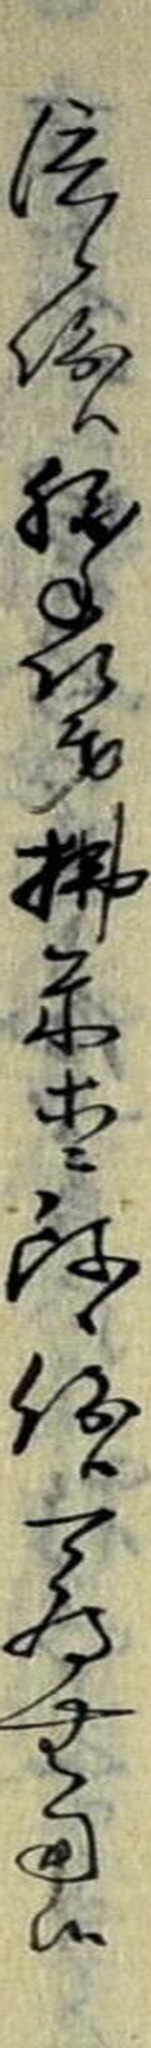渡候儀は勝手次第払米等に致候儀は可為無用候
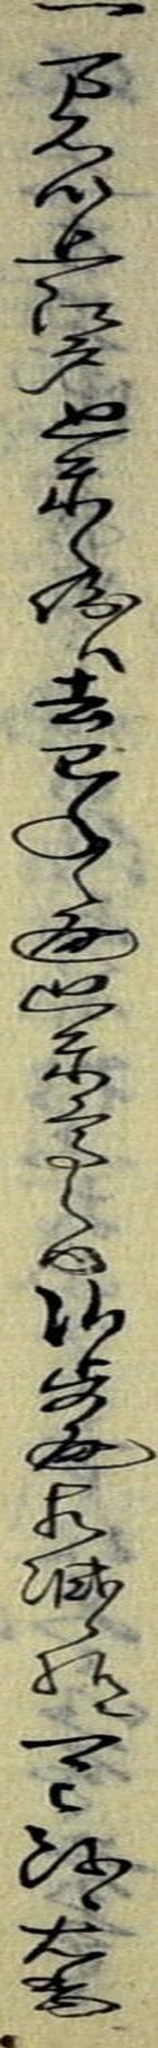一万石以上江戸廻米之儀は去巳年之通廻米高之内弐歩通相減候様に可被致候右委
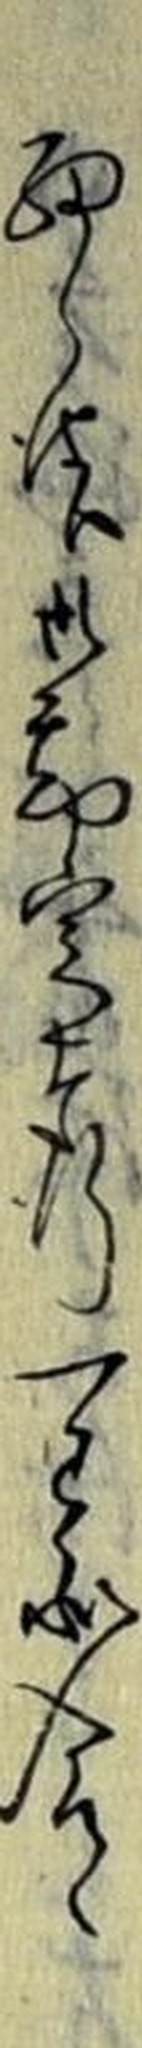細之儀は御勘定奉行可被承合候三月
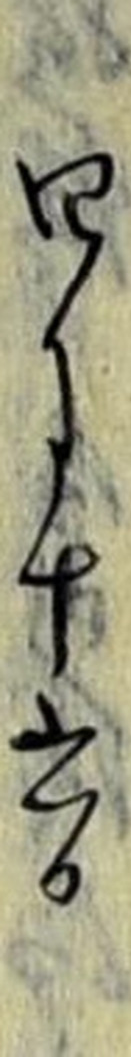四月十六日
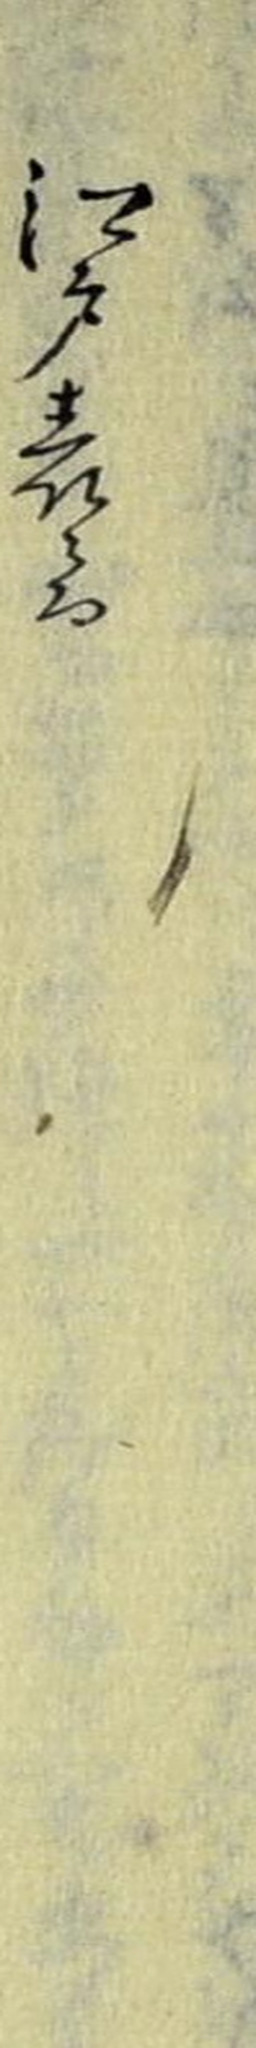江戸表に而
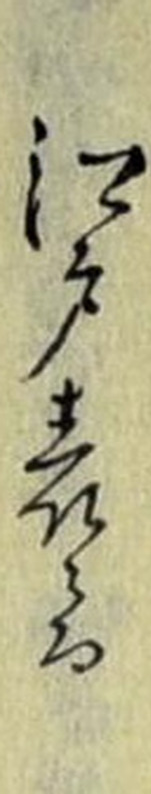江戸表に而
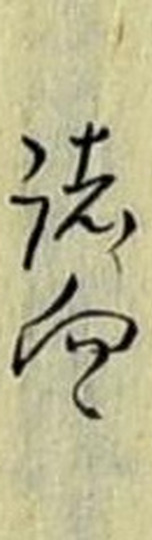諸向へ
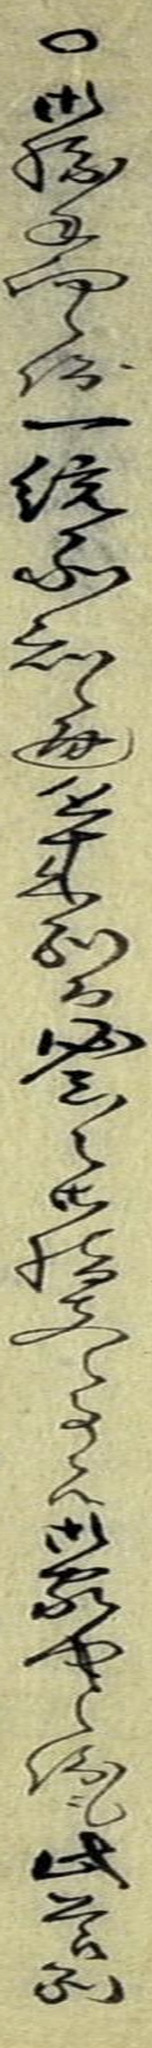〇御勝手向之儀一統承知之通近来別而必至之御指支之事に候御家中之儀も此節別
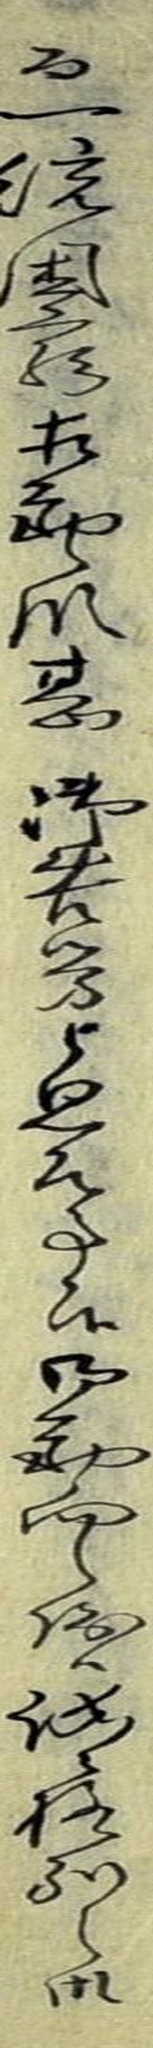而一統困窮相勤候段甚御苦労被思召事に候御勤向之儀は誠に格別之御
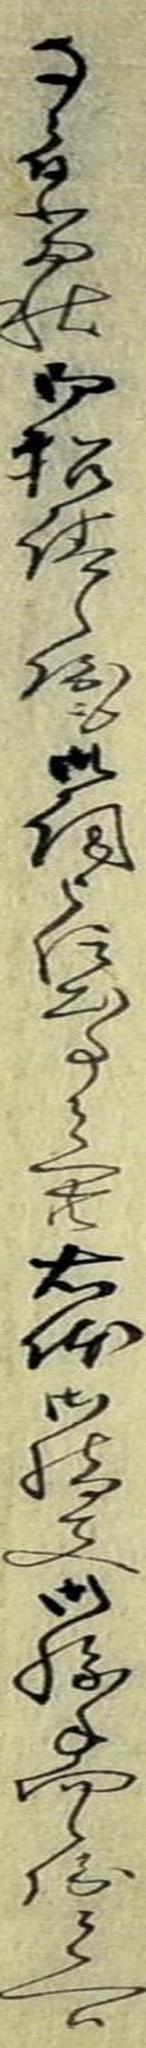事に付当秋御招請之儀も御伺被仰出事に候へ共右体御指支御勝手向之儀に候へは
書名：命令之部 二
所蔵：福井県文書館 Fukui Prefectural Archives
